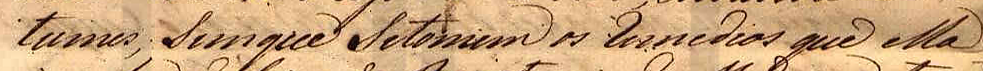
tumes, sem que Se tomem os Remedios que ella
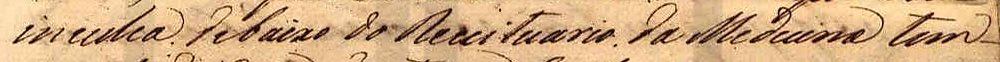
inculca debaixo do Receituario da Medecina tem
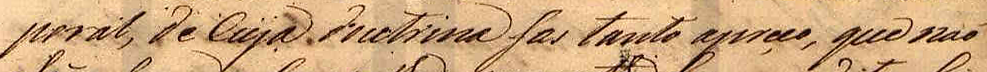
poral, de Cuja doutrina fas tanto apreço, que naõ
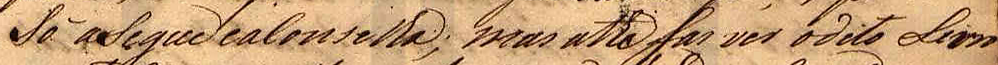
só a segue e aConselha; mas athe fas ver o dito Livro
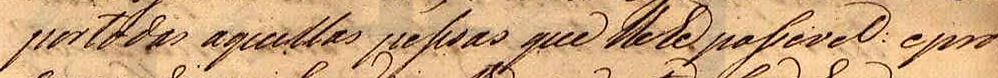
por todas aquellas pessoas que lhe he possivel: e pro
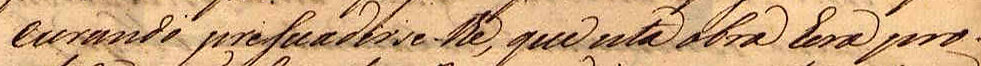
curando presuadirse-lhe, que esta obra hera pro
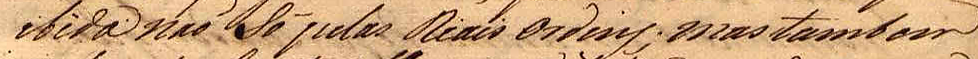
ibida naõ só pelas Reais ordens; mas tambem
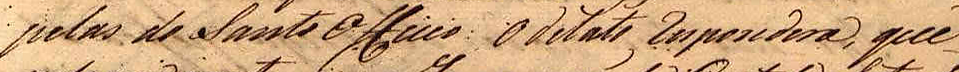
pelas do Santo Officio: o delato, Respondera, que
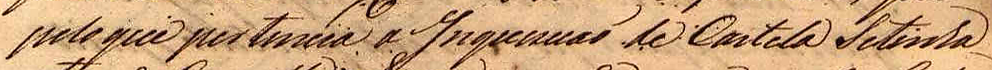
pelo que pertencia a Jnquisicaõ de Castela Se tinha
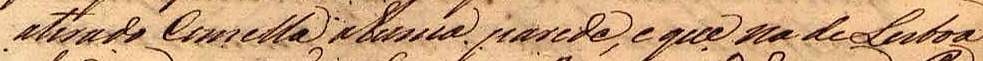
atirado Com ella a huma parede, e que na de Lisboa
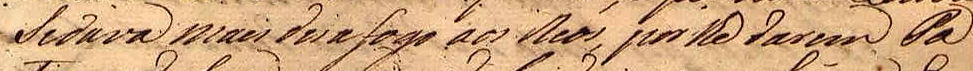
se dava mais desafogo aos Reos, por lhe darem Pa
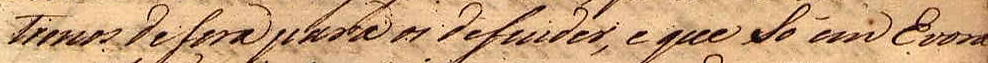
tronos de fora para os defender, e que só em Evora
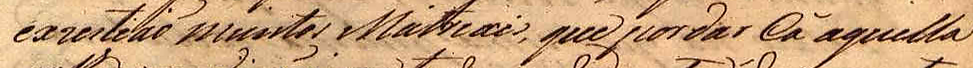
exzestiaõ muitos Matreais, que por dar Cá aquella
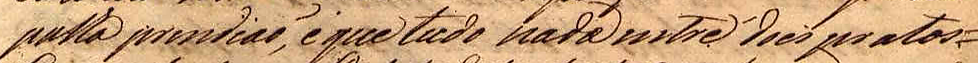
palha prendiaõ, e que tudo nada entre does pratos
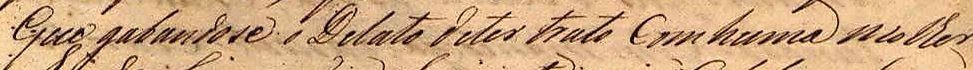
Que gabandose o Delato de ter trato Com huma molher
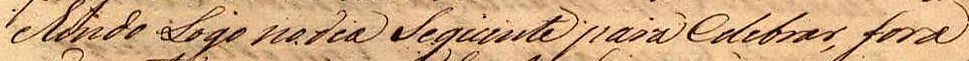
e hindo Logo no dia seguinte para Celebrar, fora
